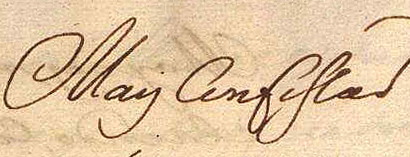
Mais confissaõ
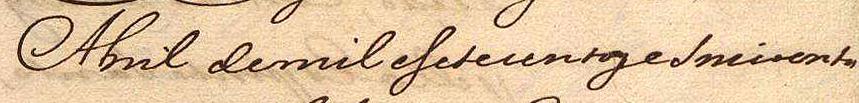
Abril de mil e setecentos e snicoenta
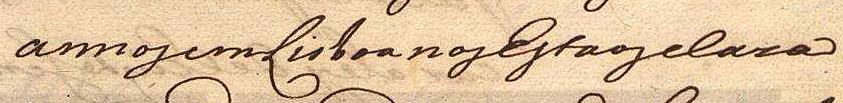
annos em Lisboa nos Estaos e caza
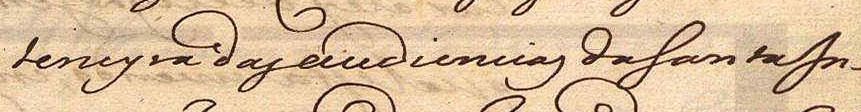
terceyra das audiencias da santa Jn
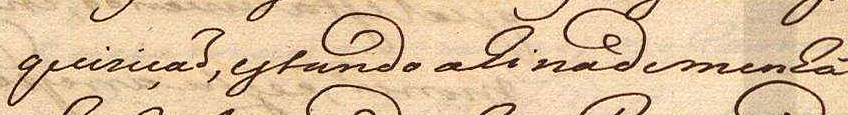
quiziçaõ, estando ahi na de menhã
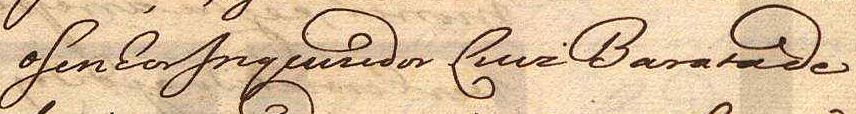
o senhor Jnquizidor Luiz Barata de
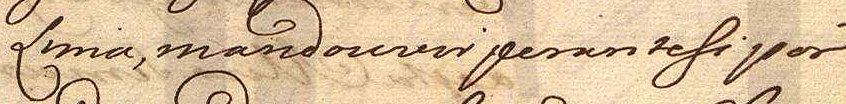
Lima, mandou vir perante si por
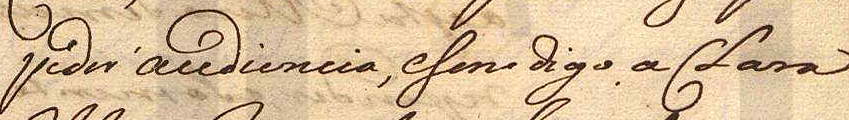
pedir audiencia, e sen digo a CLara
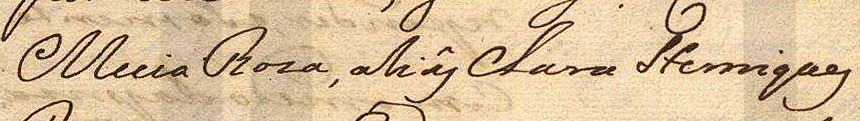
Mecia Roza, aliás cLara Henriqes
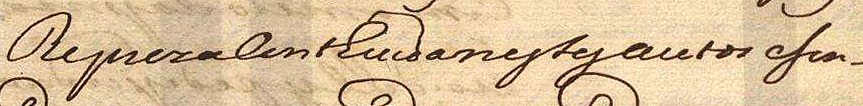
Re preza contheuda nestes autos e sen
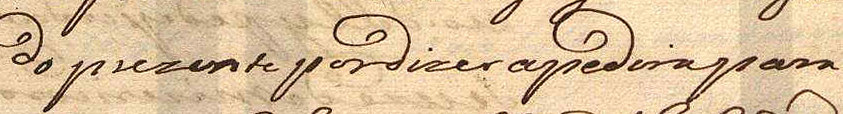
do prezente por dizer a pedira para
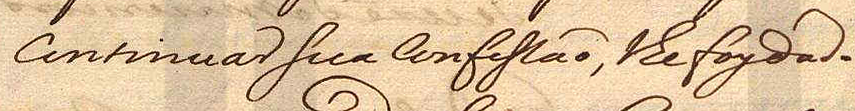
contiuar sua confissaõ, lhe foy dado
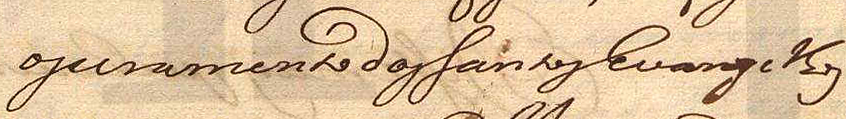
o juramento dos santos Evangelhos
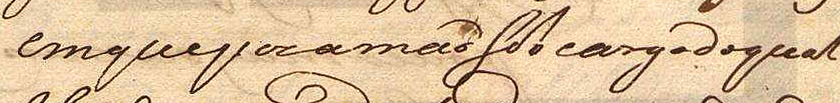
em que poz a maõ sob cargo do qual
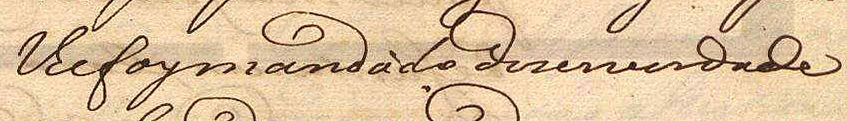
lhe foy mandado dizer verdade
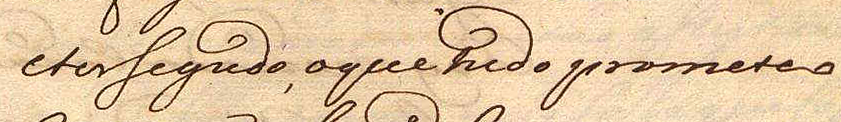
e ter segredo, o que tudo prometeo
